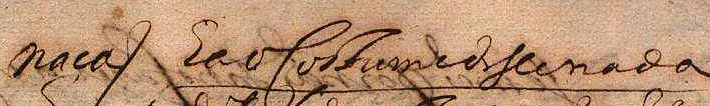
naçaõ E ao Costume disse nada
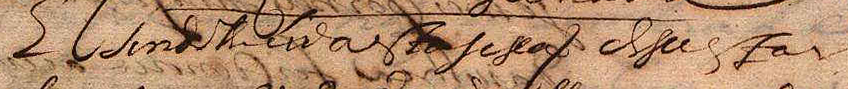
E sendo lida a esta sessaõ disse estar
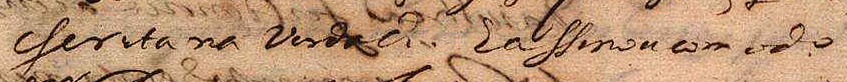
escrita na verdade E assinou com o d.o
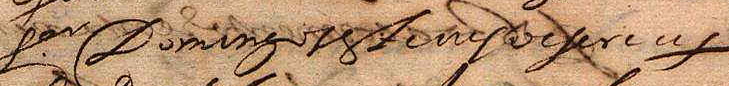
S.or Domingos steues o escreuj
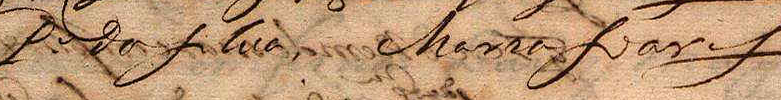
P.o da silua. Maria Soares
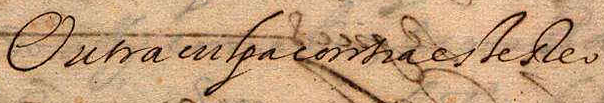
Outra culpa contra este Reo
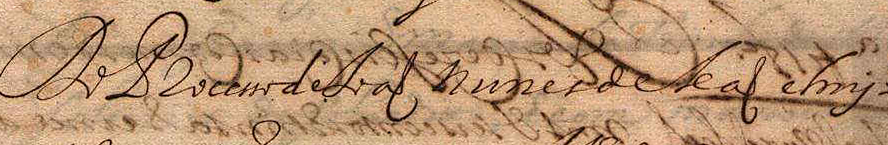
Do Processo de Joaõ nunes de Leaõ chris
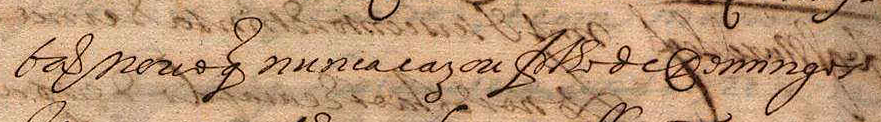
taõ nouo q̄ nunca cazou filho de Domingos
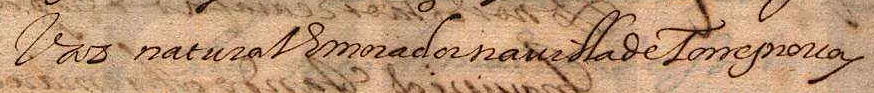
Vaz natural E morador na uilla de Torres nouas
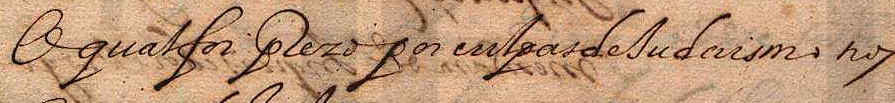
O qual foi prezo por culpas de Judaismo nos
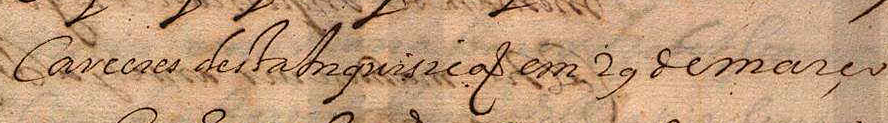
Carceres desta Inquisiçaõ em 29 de março
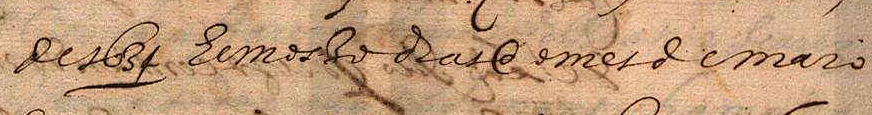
de 1634 E em os 30 dias do mes de maio
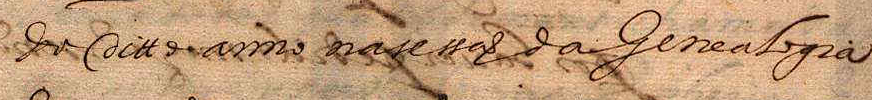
do ditto anno na sessaõ da Genealogia
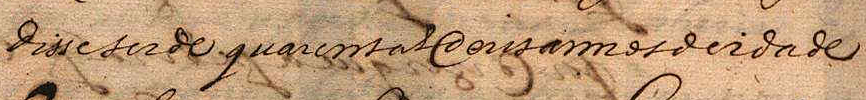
disse ser de quarenta e dous annos de idade
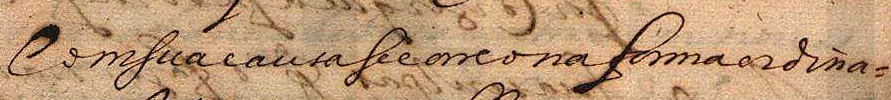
Com sua causa se correo na forma ordina
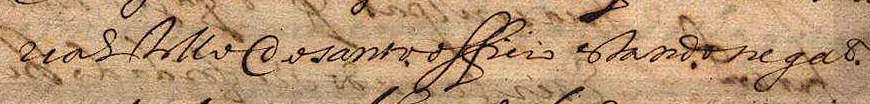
ria E estillo do santo officio estando negat.o
